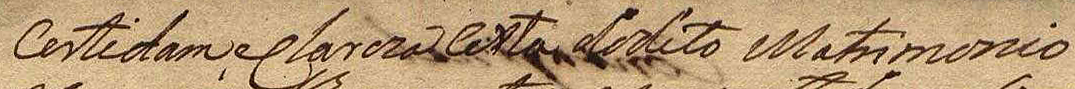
certidam, e Clareza certa do dito Matrimonio
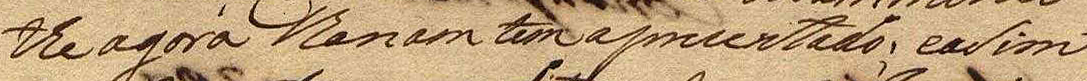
the agora lhe nam tem a prezentado; e asim
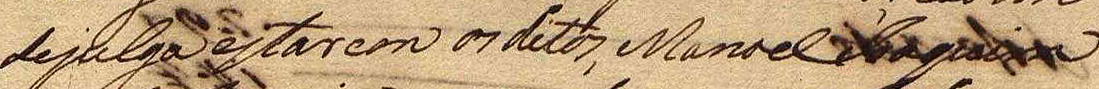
se julga estarem os ditos, Manoel Ioaquim
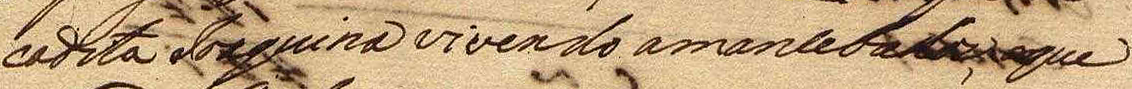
e a dita Ioaquina vivendo amancebadoz, e que
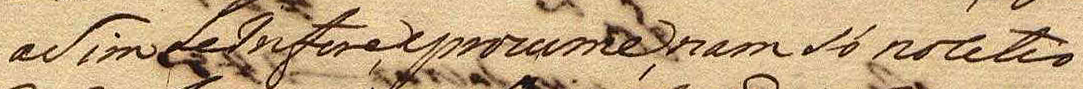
asim se Infere, e prezume, nam só no citio
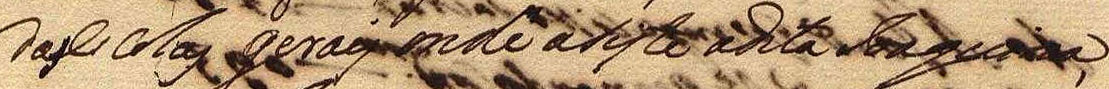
das escolas gerais onde asiste a dita Ioaquina,
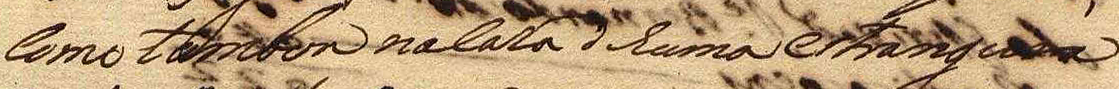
como tambem na caza dhuma estrangeira
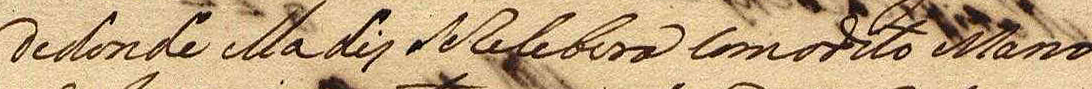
de donde ella dis se ReCebera com o dito Mano
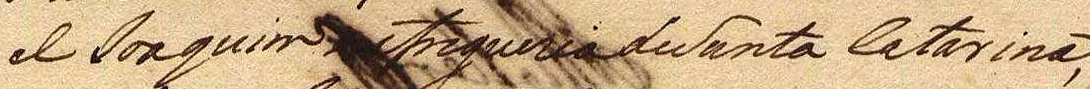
el Ioaquim _ frigueziade santa Catarina,
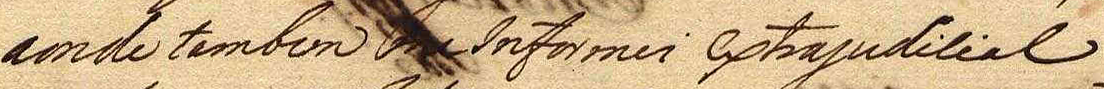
aonde tambem _ Informei extrajuicial
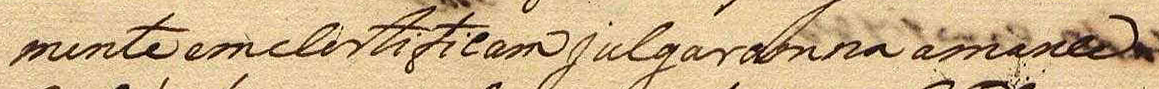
mente em emdertificamjulgaramna amance
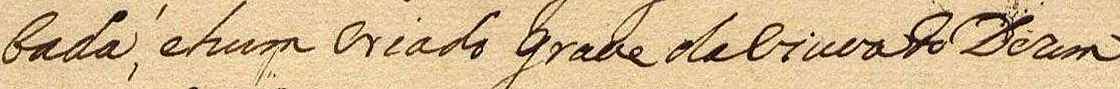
bada, e hum criado grave da viuva do Dezem
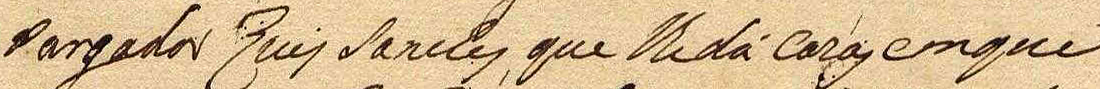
bargador Luis Sanches, que lhe dá cazas em que
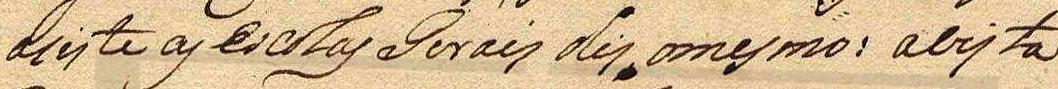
asiste as EscoLas Gerais dis o mesmo: a vista
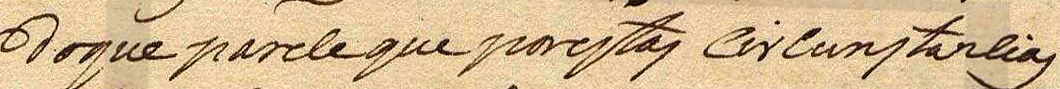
do que parece que por estas circunstancias
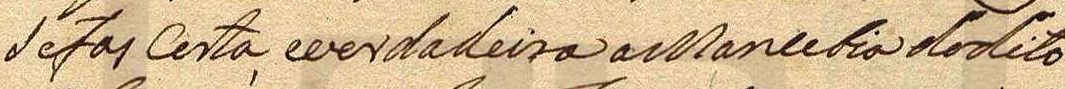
se fas certa, e verdadeira aMancebia do dito
